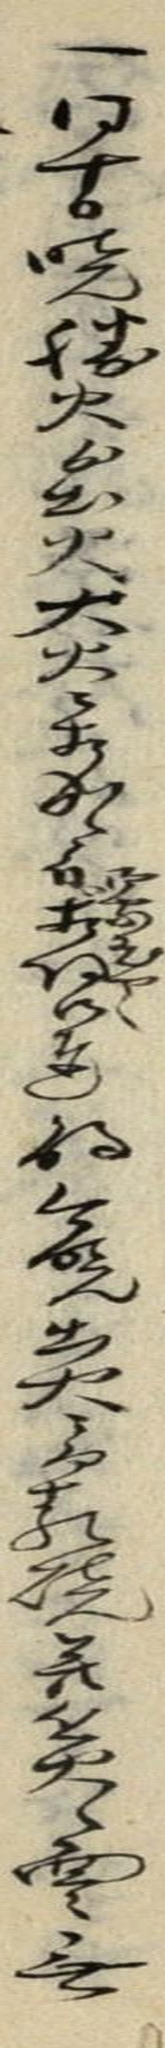一同十日暁勝火ゟ出火大火に相成候に付御家老中へ相伺口達触今晩出火にて類焼并近火之面々無
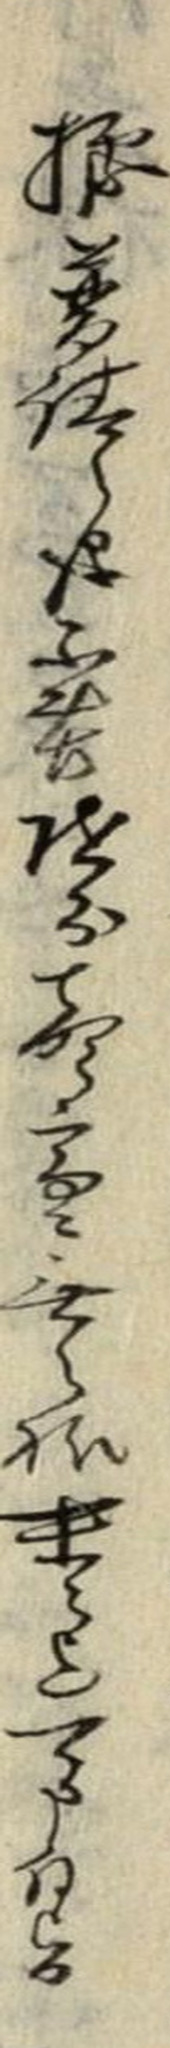拠普請之儀不苦随分声高に無之様末々迄可申付旨
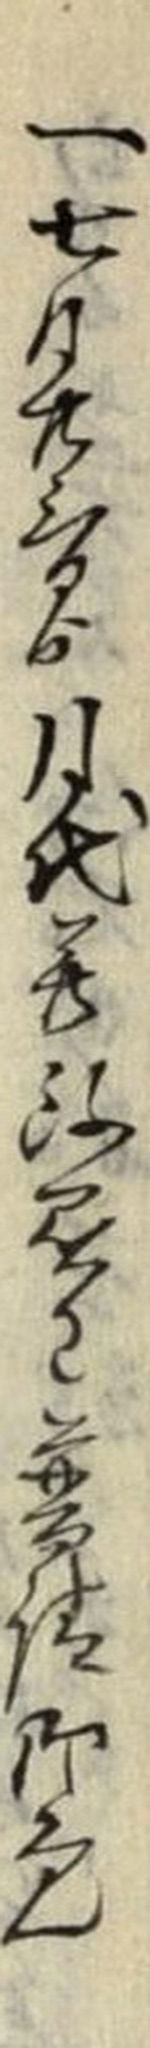一七月廿三日ゟ月代并致懸り候普請御免
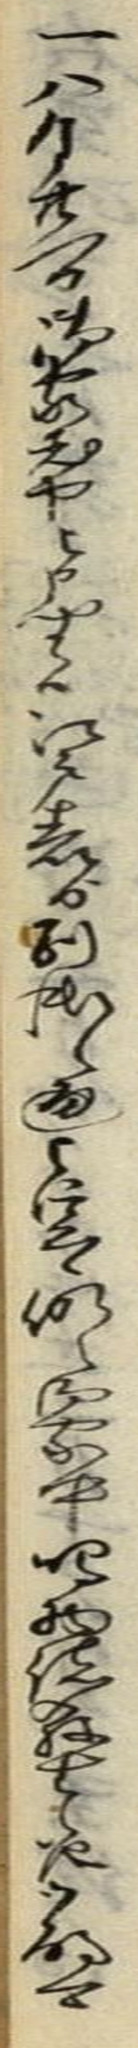一八月廿一日御家老中被申聞候は江戸表ゟ別紙之通被仰出候仍之御家中鳴物諸殺生之儀御触可
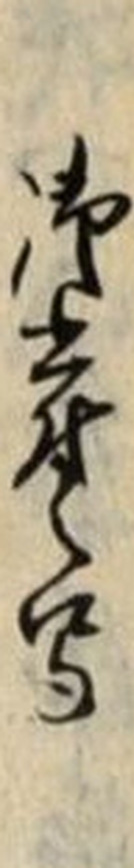御書付之写
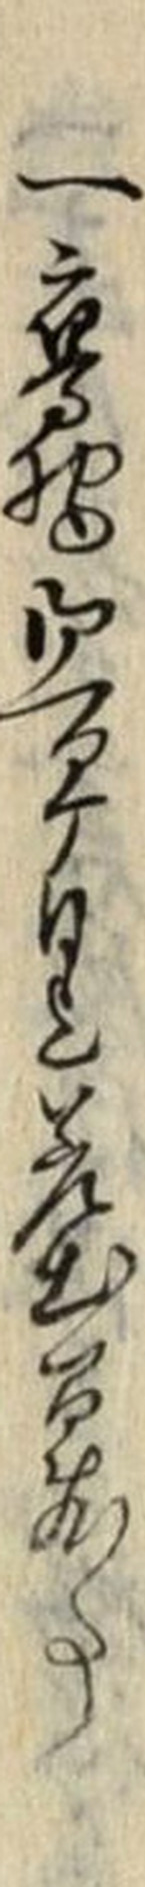一鷹狩御百ケ日迄差出間敷事
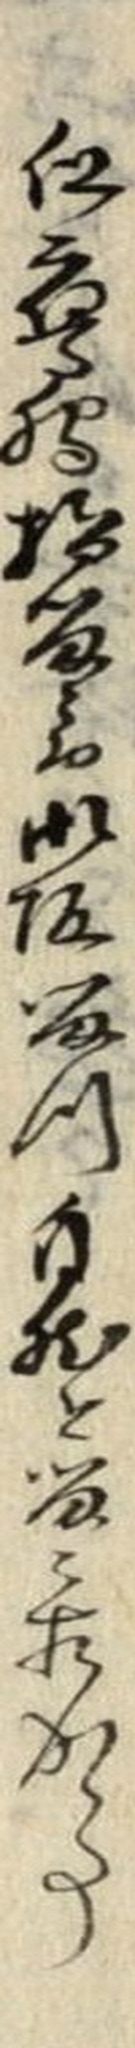但鷹狩指留にて御坂留川自然と留に相成候事
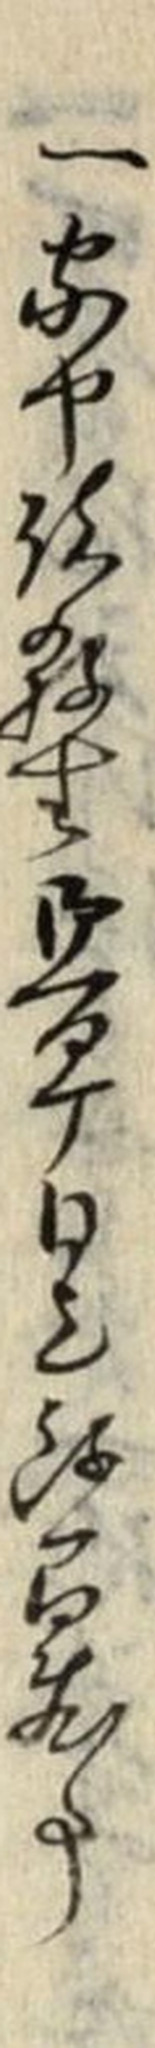一家中諸殺生御百ケ日迄致間敷事
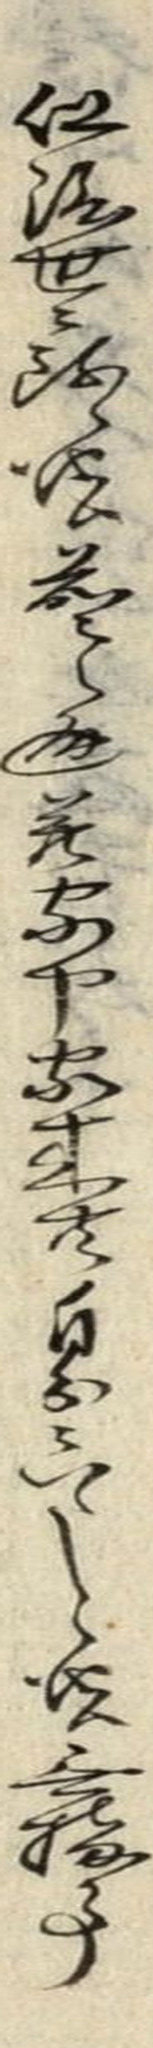但渡世に致候儀は前々之通并家中家来共自分にいたし候儀は無構事
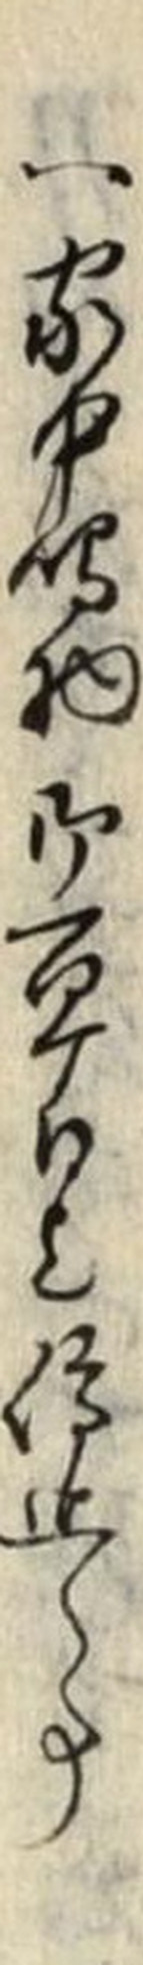一家中鳴物御百ケ日迄停止之事
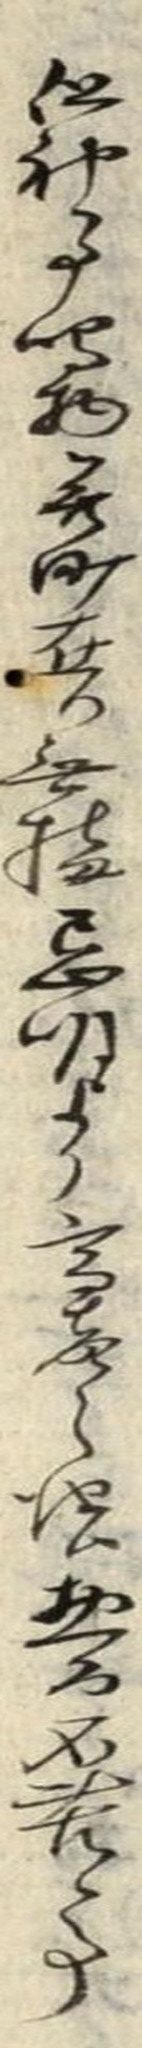但神事鳴物并町在は無構忌明より高声之儀は惣て不苦候事
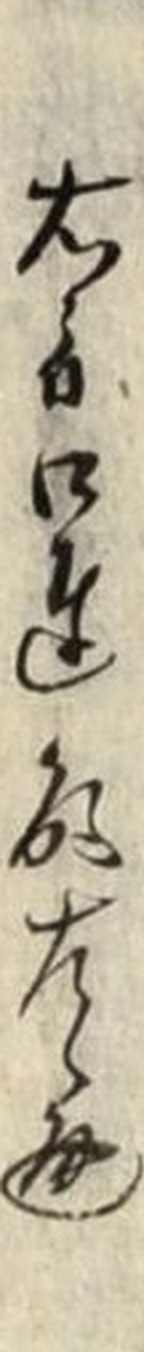右に付口達触左之通
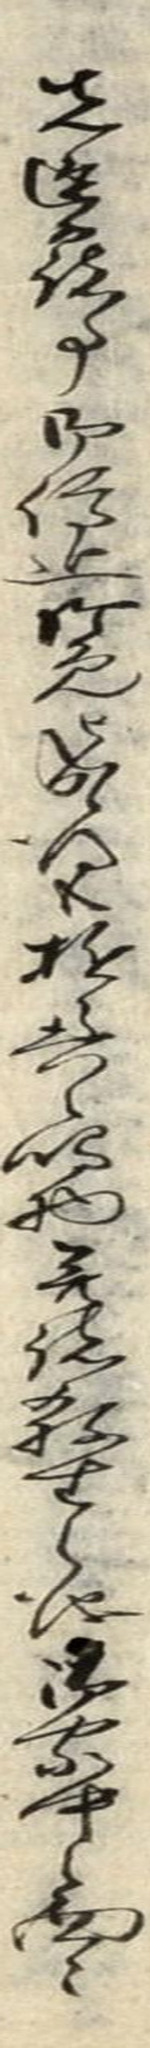先達て諸事御停止御免被成候得共遊興之鳴物并諸殺生之儀御家中之面々
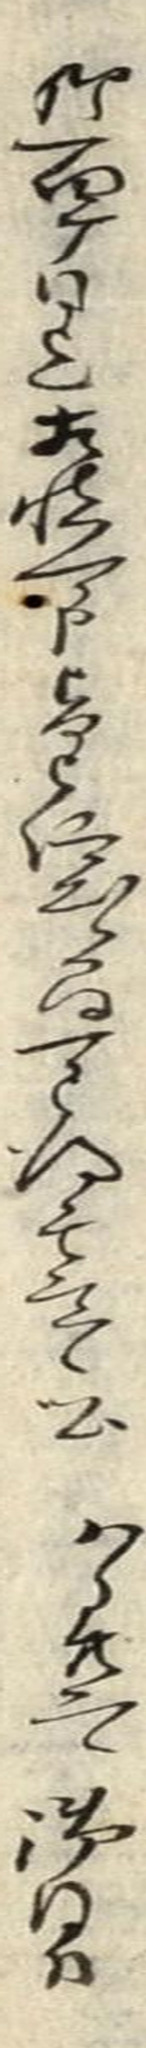御百ケ日迄相慎可申旨被仰出候間可被得其意候以上八月廿二日御目付
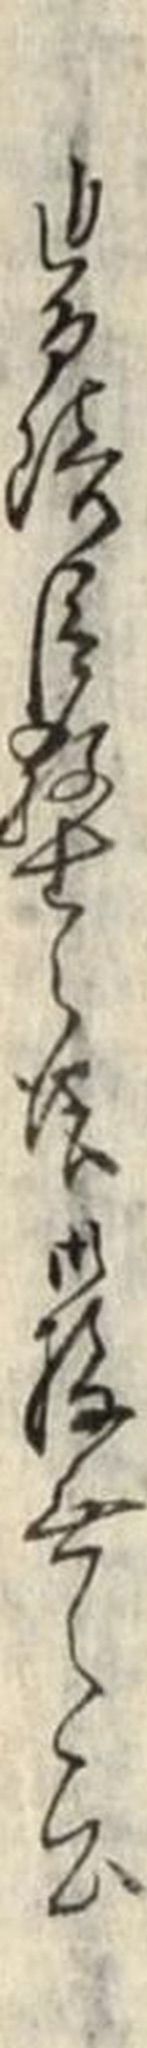追て陪臣殺生之儀は御構無之候以上
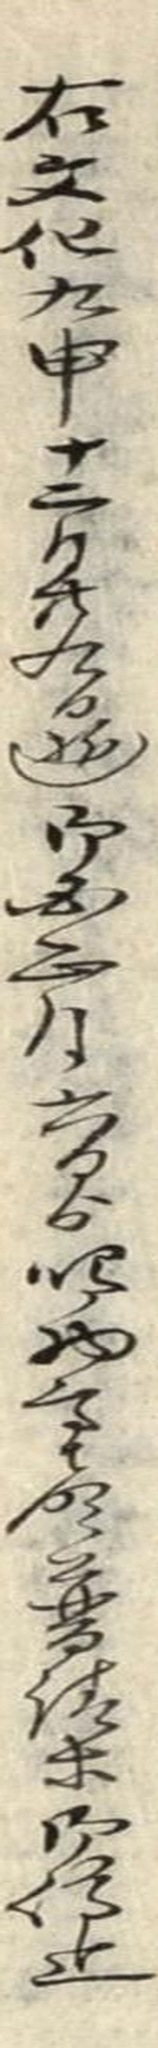右文化九申十二月廿九日逝御国正月六日ゟ鳴物高声普請等御停止
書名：御停止異変死失
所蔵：福井県文書館 Fukui Prefectural Archives
